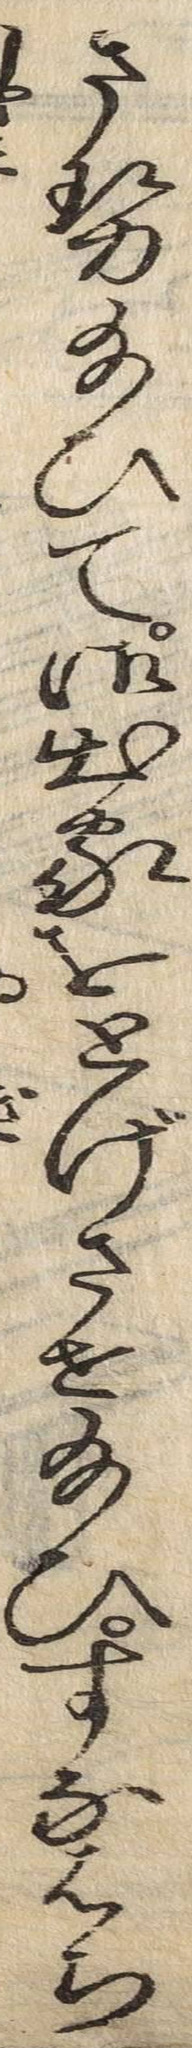させ給ひて。御出家をとげさせ給ひ。すなはち
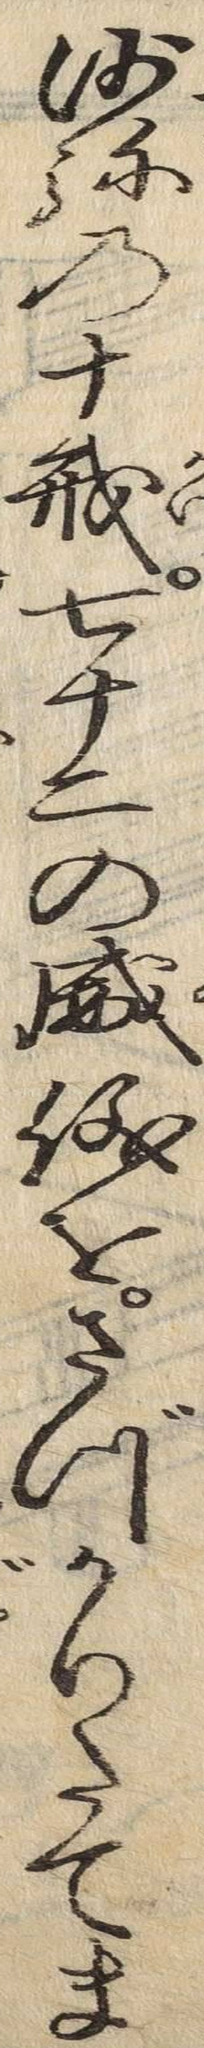沙弥の十戒。七十二の威儀を。さづかりたてま
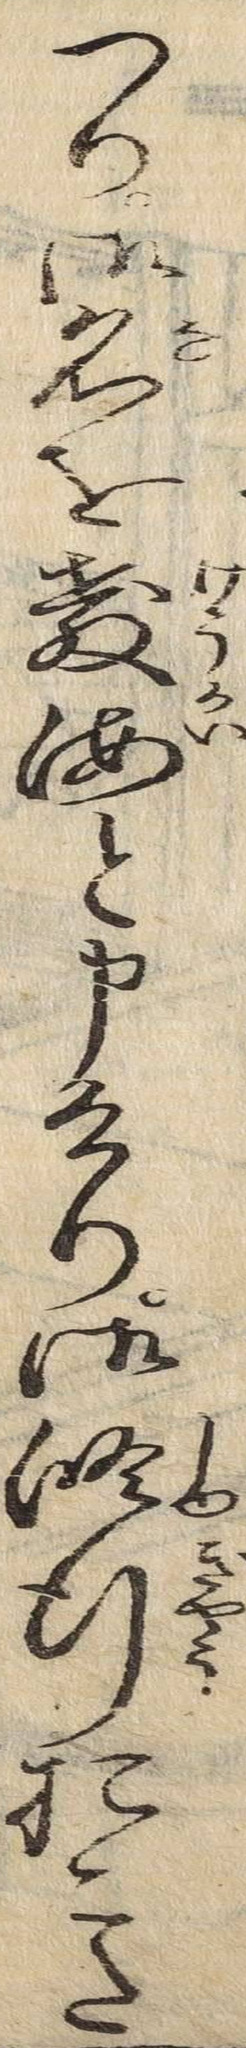つり。御名を教海と申けり。御修行おこた
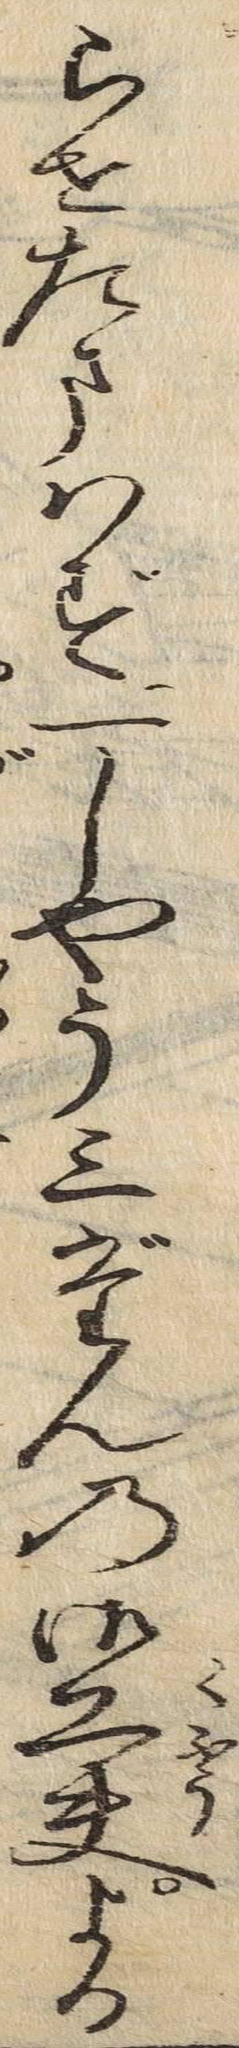らせたまはず。一しやう三だんの御工夫。より
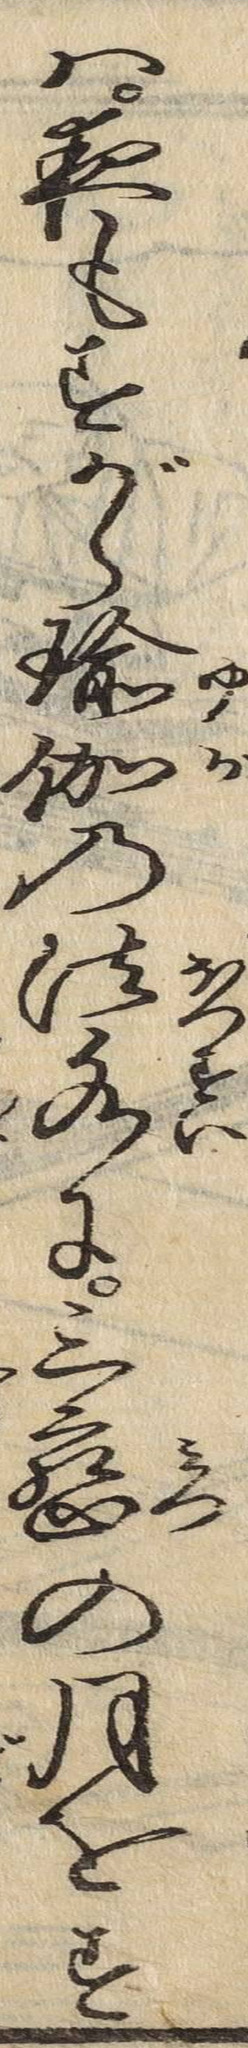は。夜もすがら瑜伽の法水に。三密の月をす
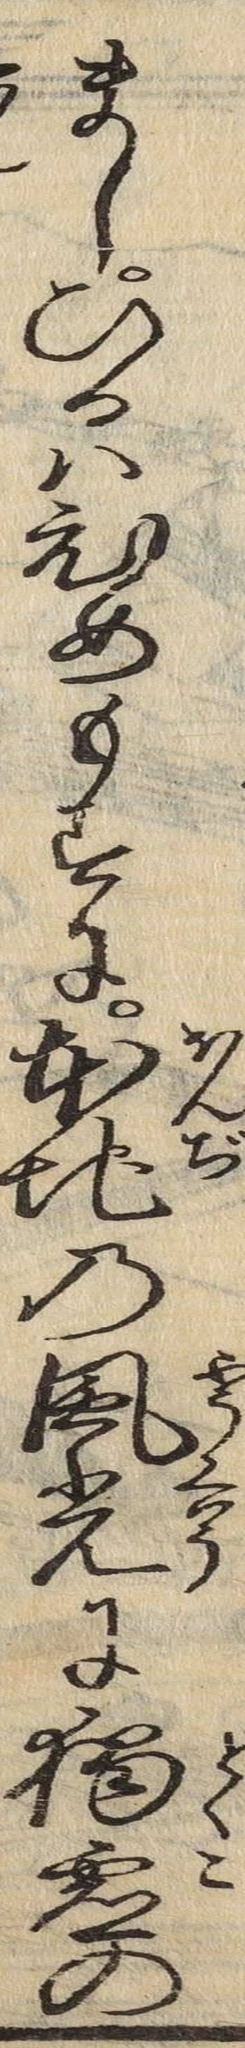まし。ひるはひめもすに。本地の風光に独虚の
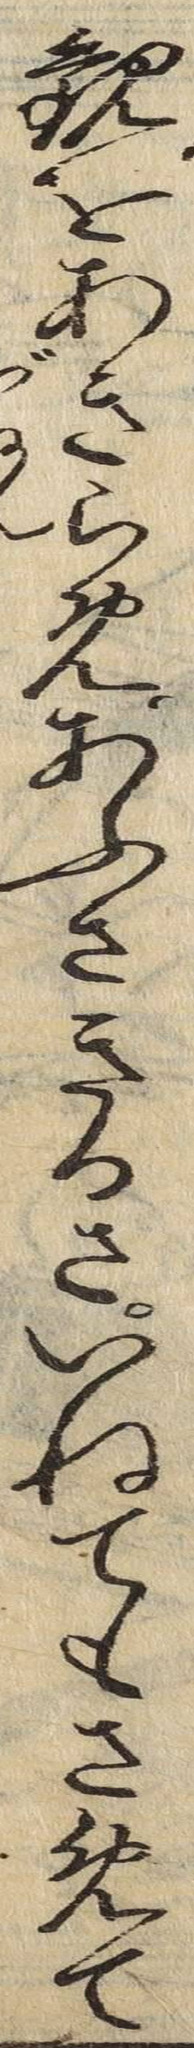観をあきらめ。あふさきるさ。いねてもさめて
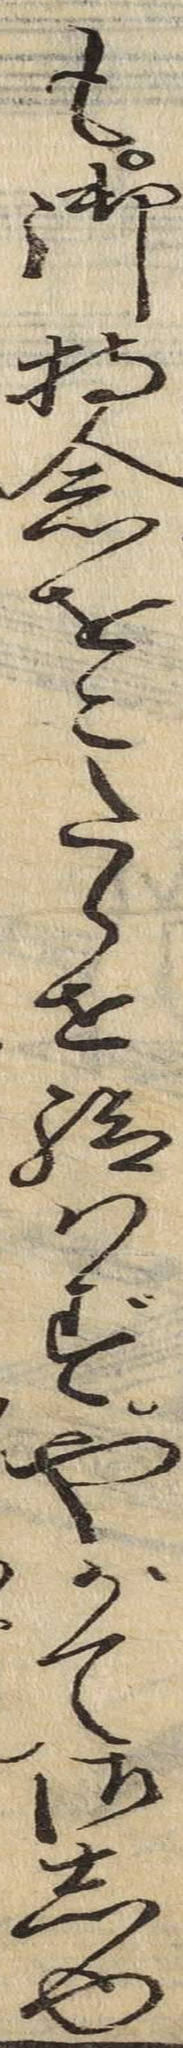も御持念をこたらせ給はず。やがて御しゆ
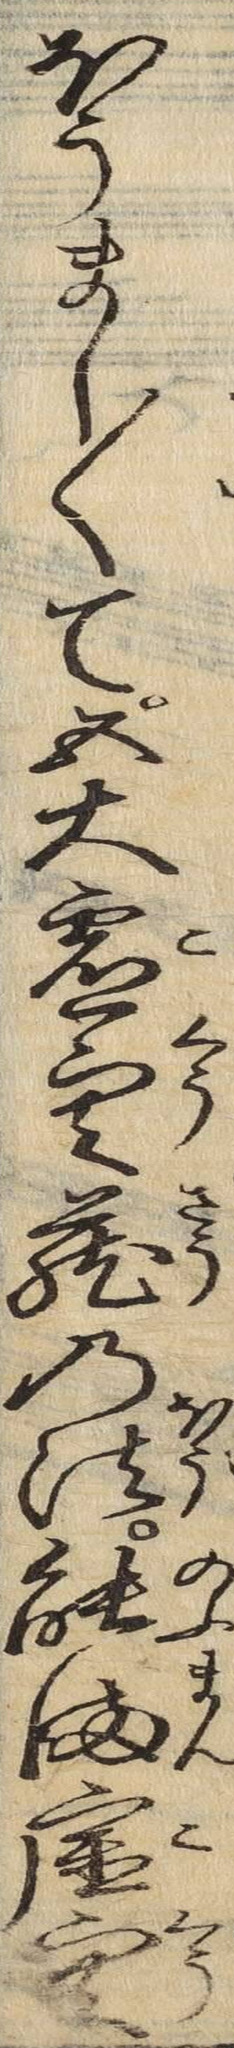ほうまし〳〵て。五大虚空蔵の法。能満虚空
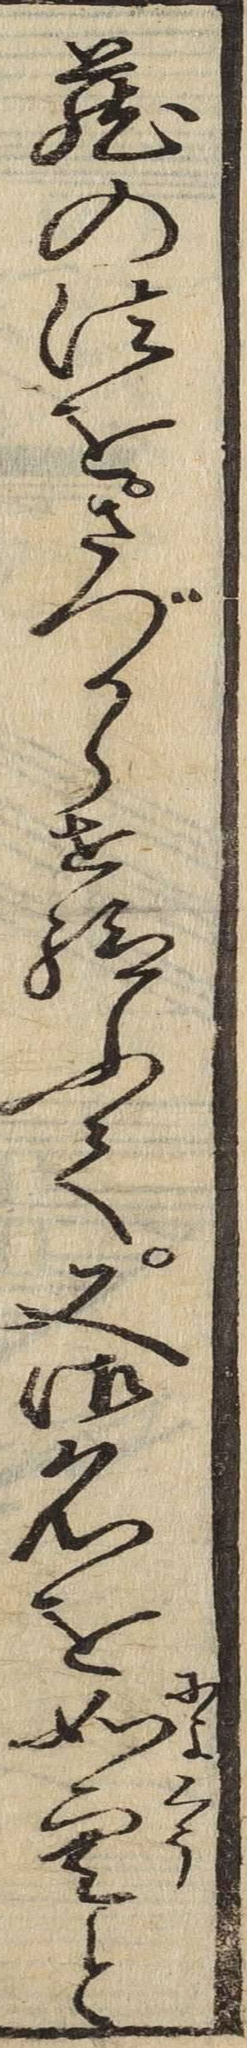蔵の法をさづからせ給ふて。又御名を如空と
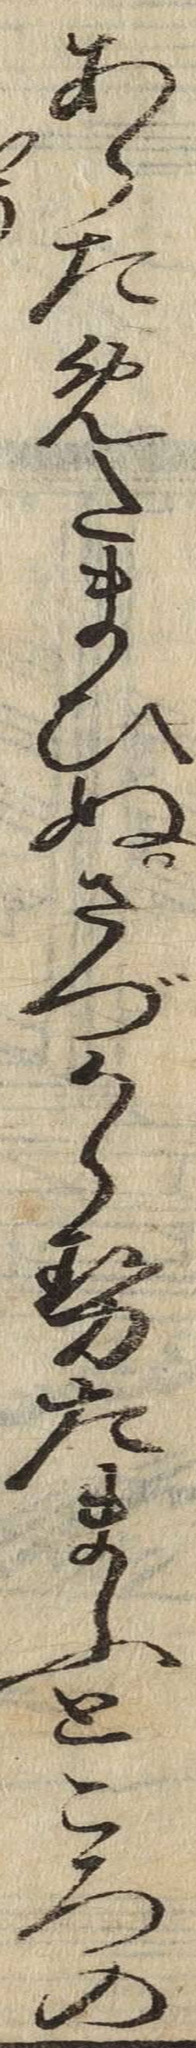あらためたまひぬ。さづかりさせたまふところの
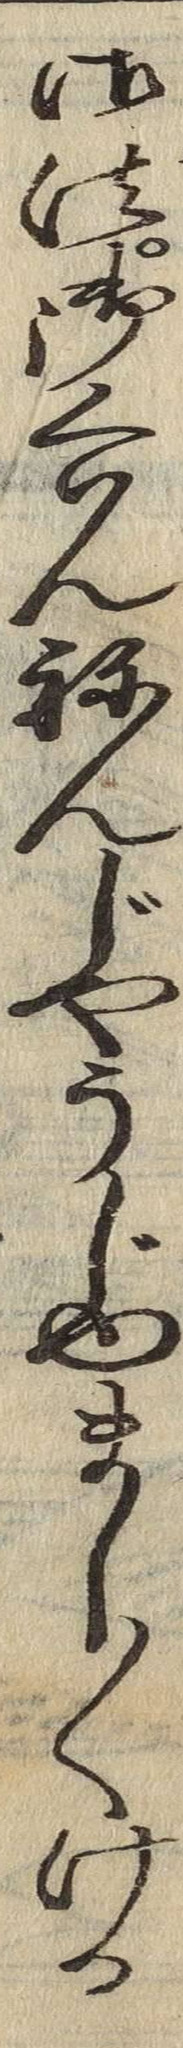御法。御くはんねんじやうじゆまし〳〵ける

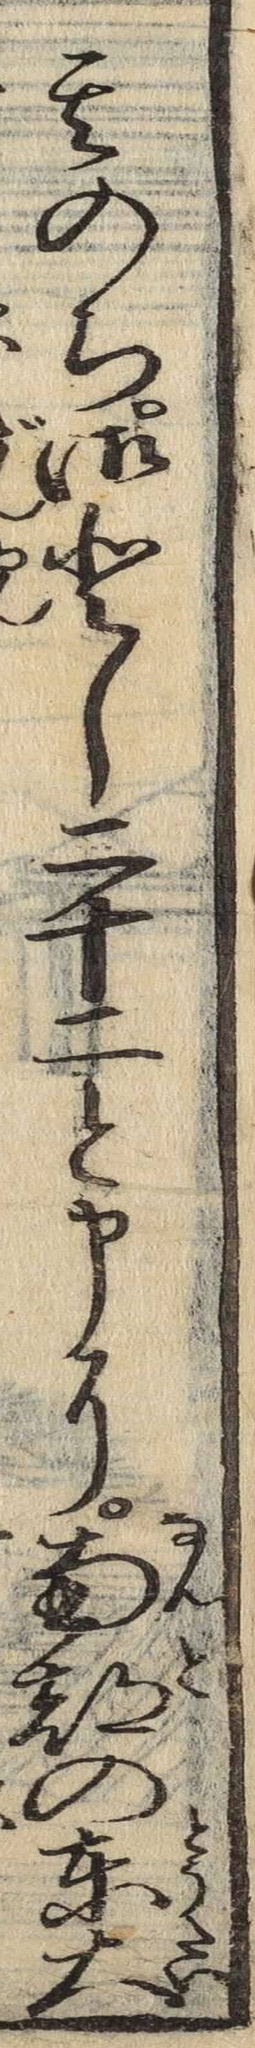其のち。御とし二十二と申に。南都の東大
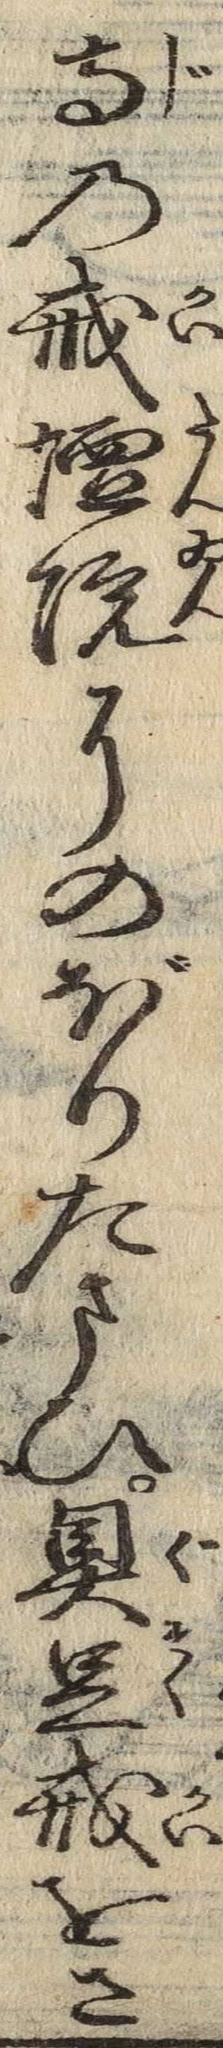寺の戒壇院にのぼりたまひ。具足戒をさ
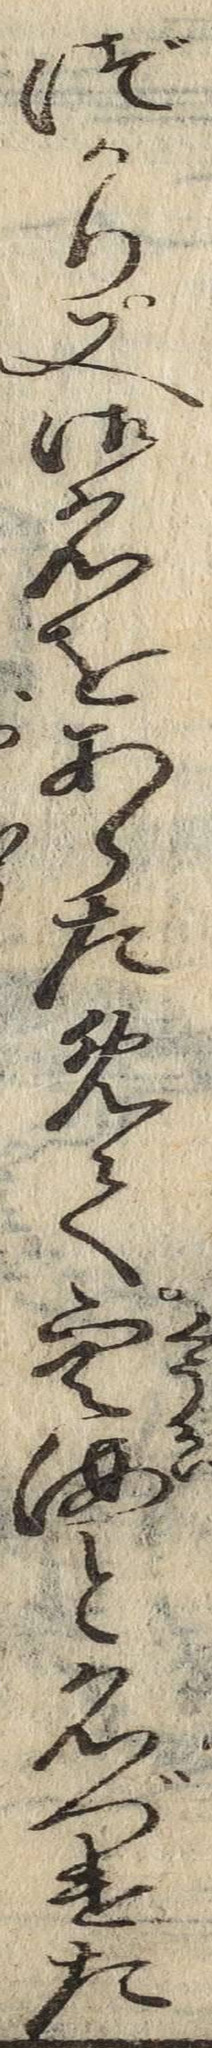づかり。又御名をあらためて。空海と名づけた
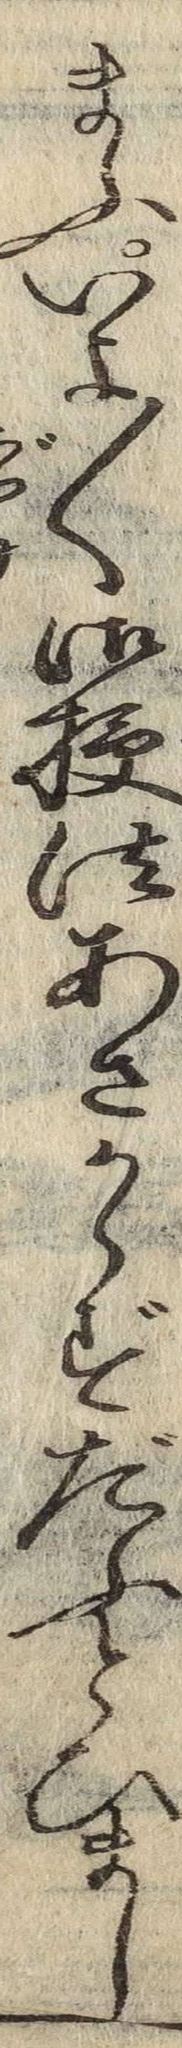まふ。いよ〳〵御授法あさからずだふとひまし
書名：弘法大師御傳記
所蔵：京都府立京都学・歴彩館 国文学研究資料館
